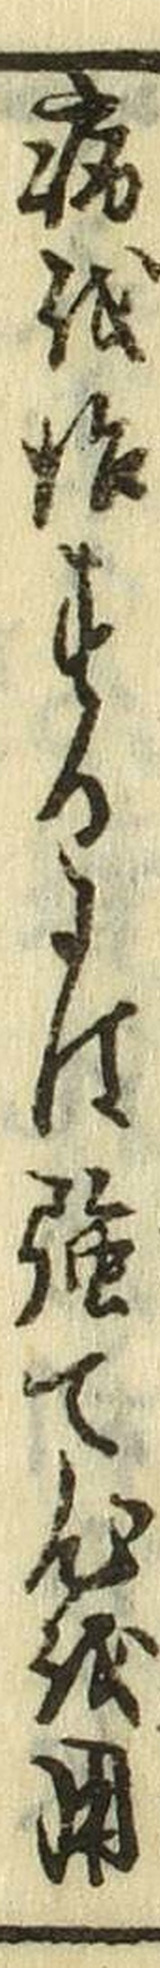病を治するには強て心を用
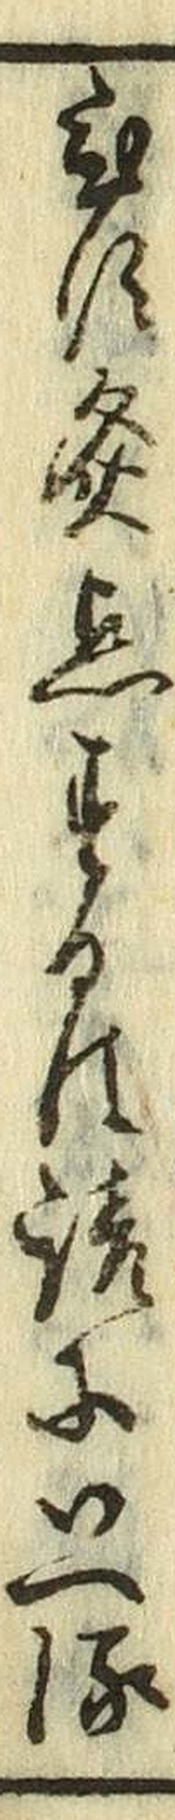ひす灸点するは諺にいへる
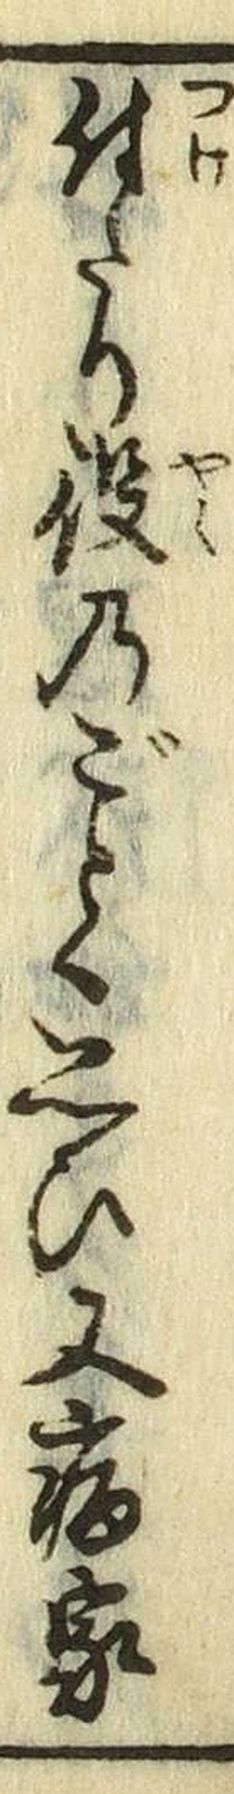付たり役のごとく思ひ又病家
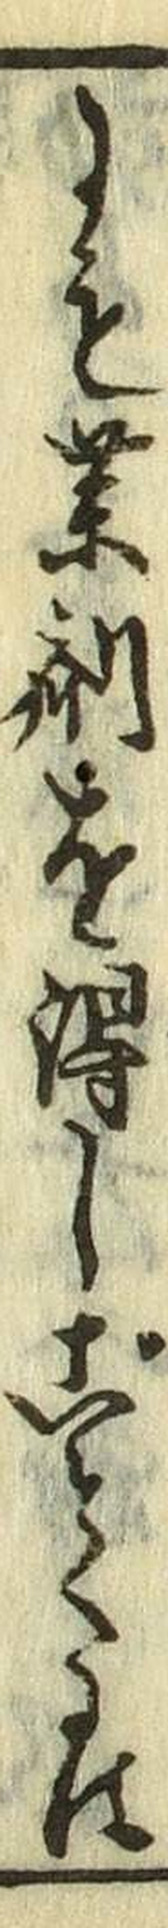にも薬剤を得しごとくには
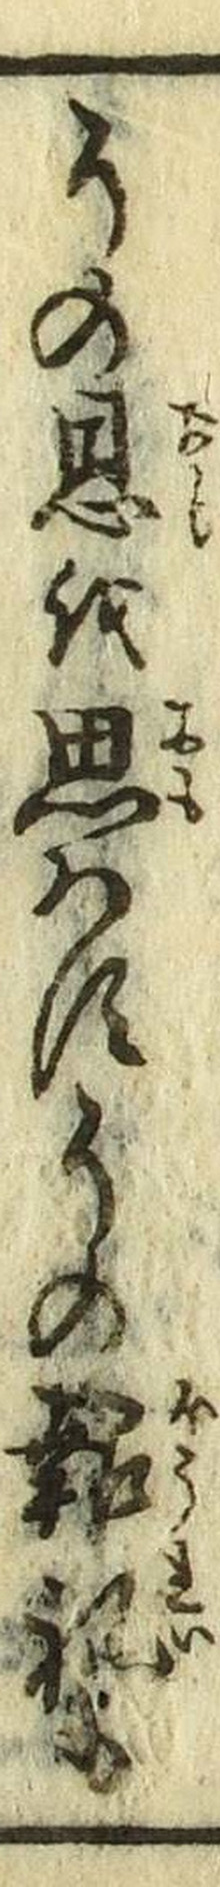その恩を思はすその報礼も
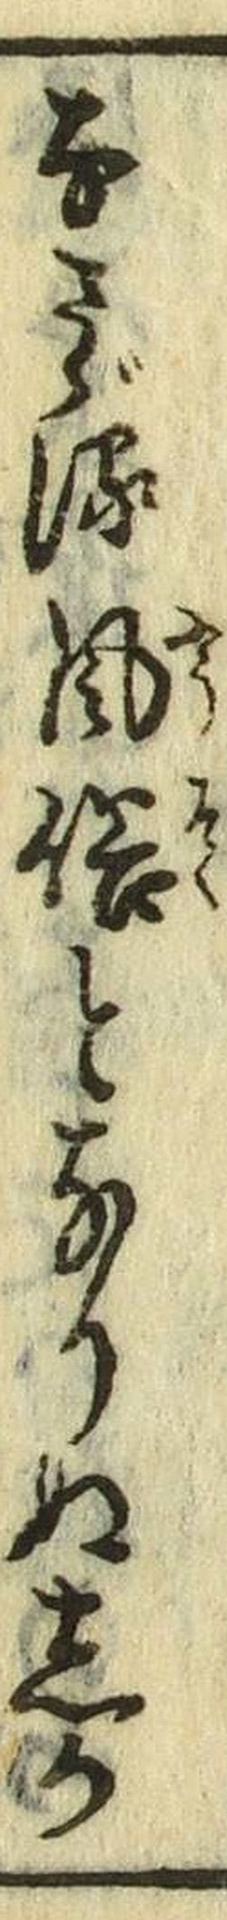なさゞる風俗となりぬしか

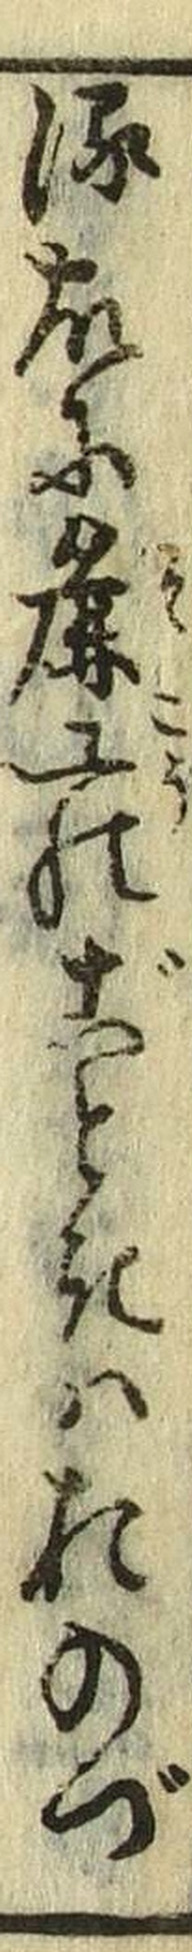る故に麤工のごときはおのづ
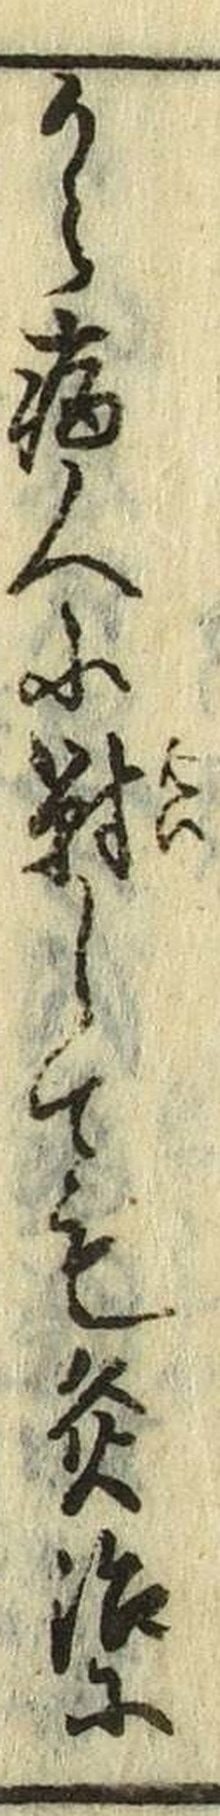から病人に対しても灸治に
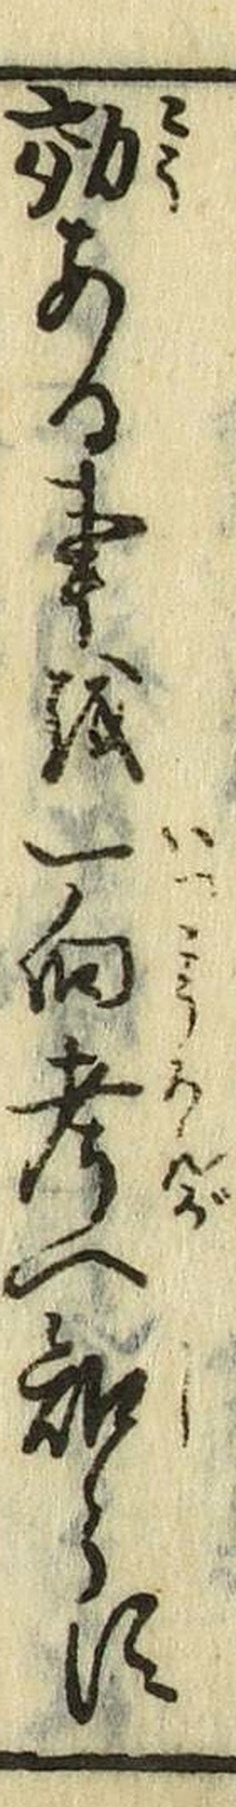効ある事を一向考へ知らす
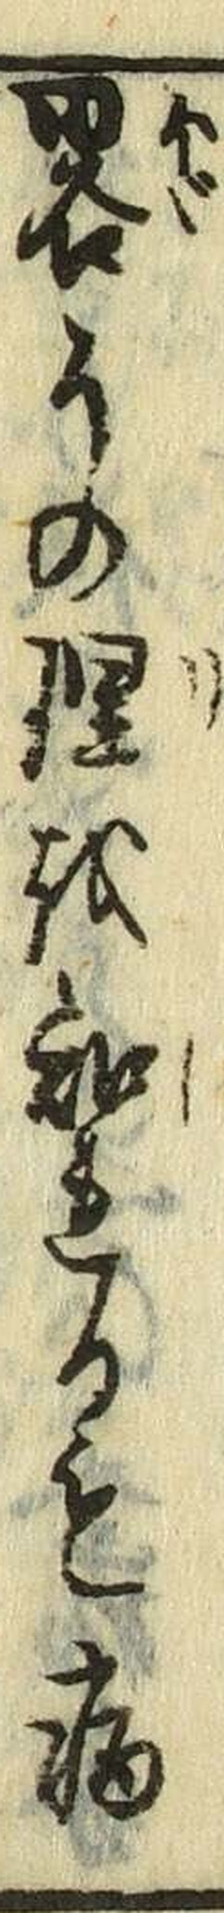略その理を知れるも病
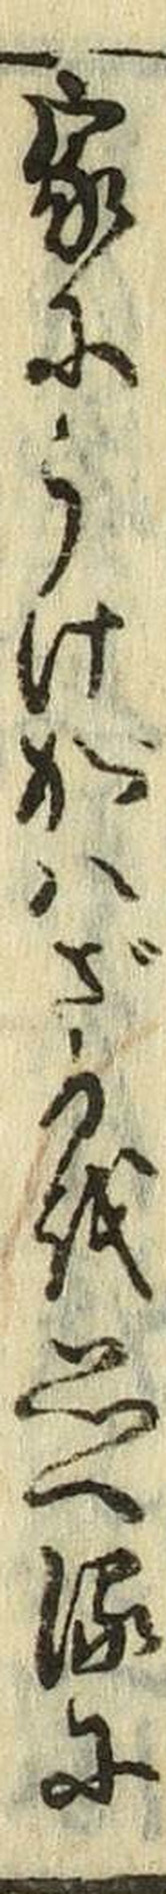家にうけがはざるを思へるに
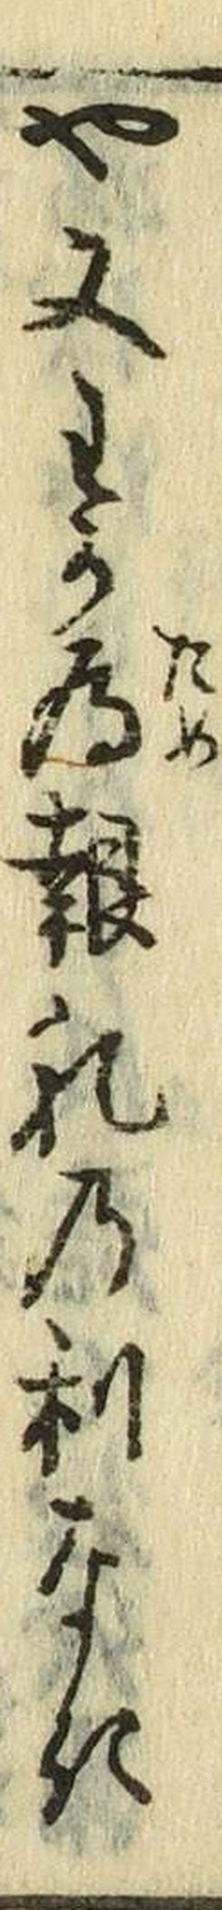や又わか為報礼の利なき
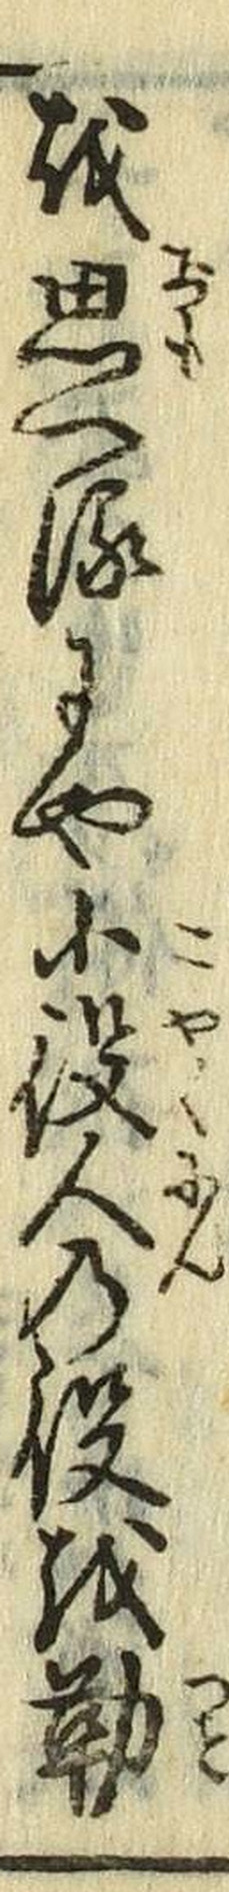を思へるにや小役人の役を勤
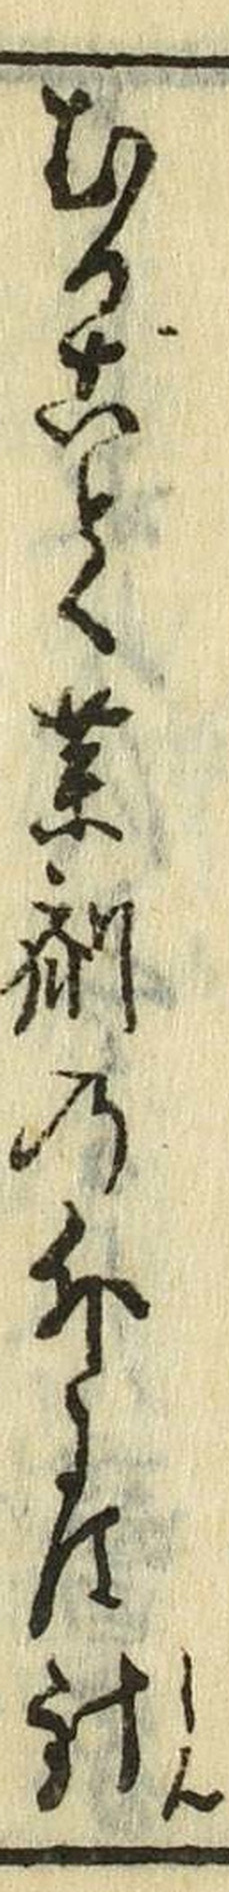むるごとく薬剤の外には針
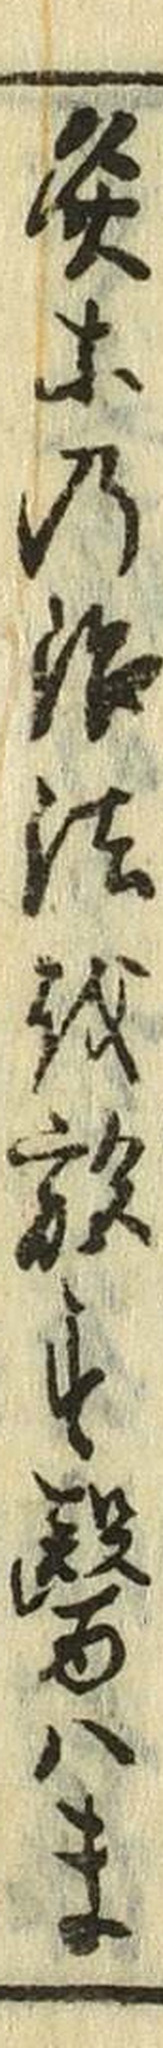灸等の治法を施す医はま
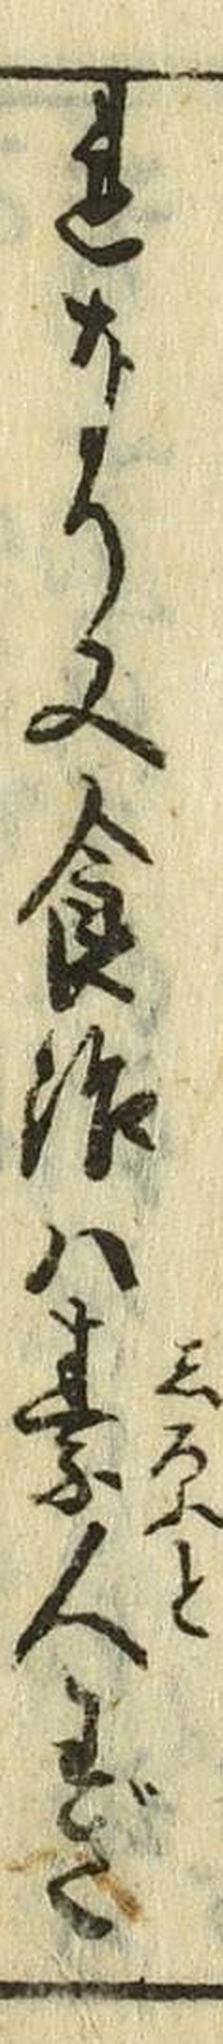れなり又食治は素人わざ
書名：居家養生記
